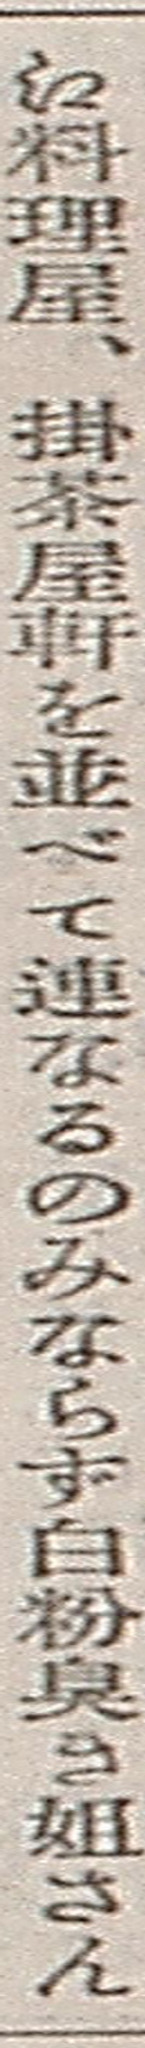江料理屋、掛茶屋軒を並べて連なるのみならず白粉臭き姐さん
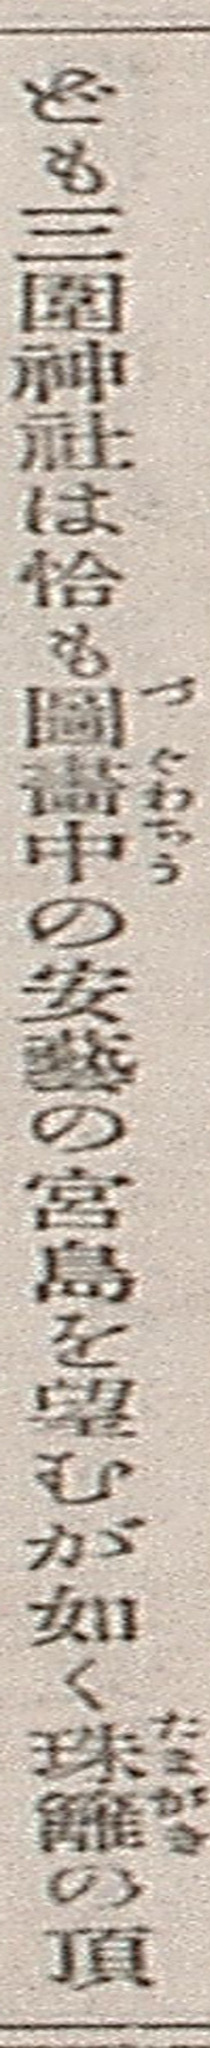ども三囲神社は恰も図画中の安芸の宮島を望むが如く玉籬の頂
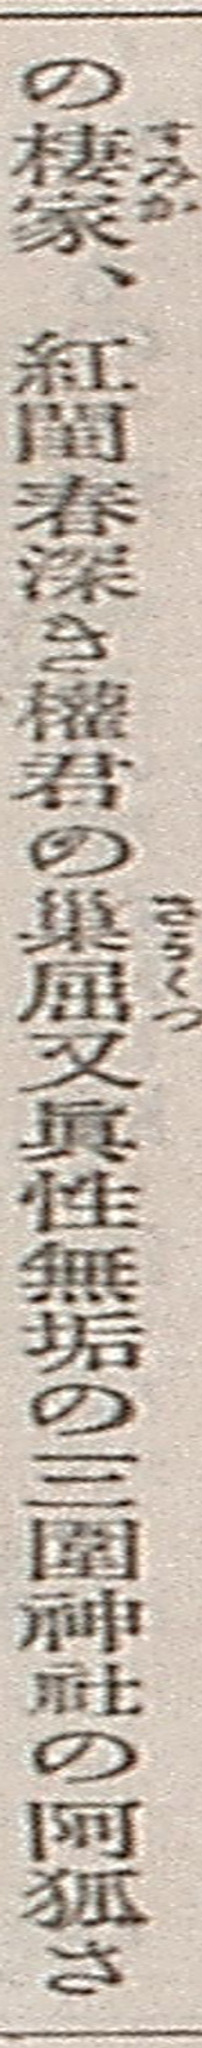の棲家、紅閨春深き権君の巣窟又真性無垢の三囲神社の阿狐さ
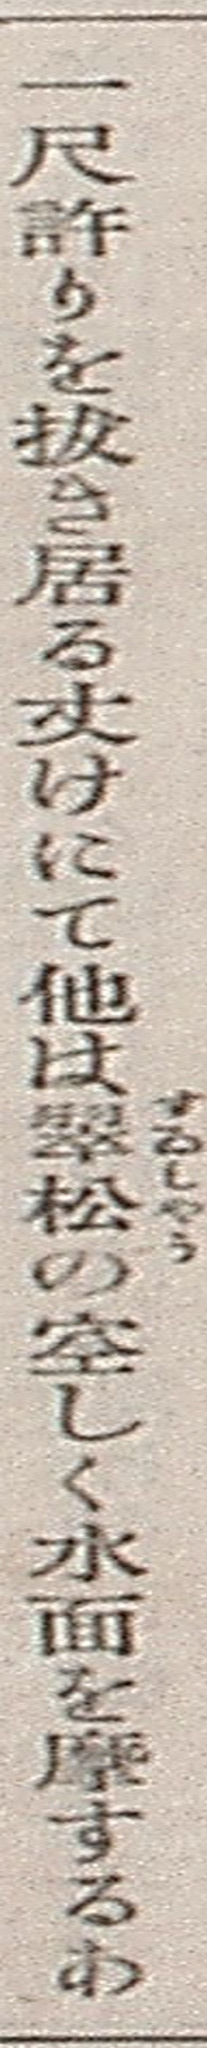一尺許りを抜き居る丈けにて他は翠松の空しく水面を摩するあ
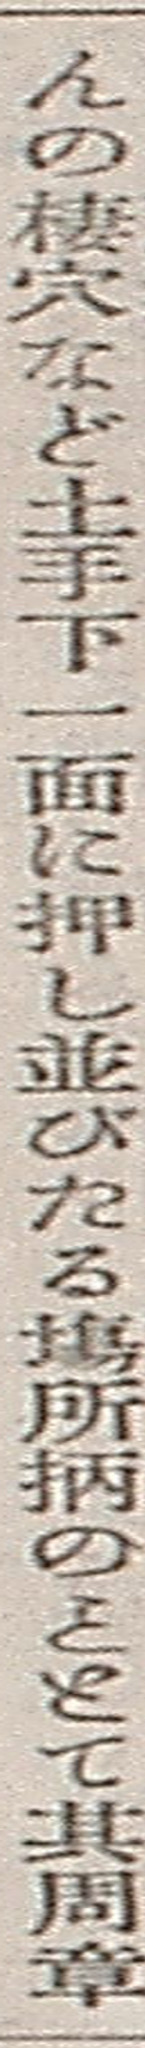んの棲穴など土手下一面に押し並びたる場所柄のこととて其周章
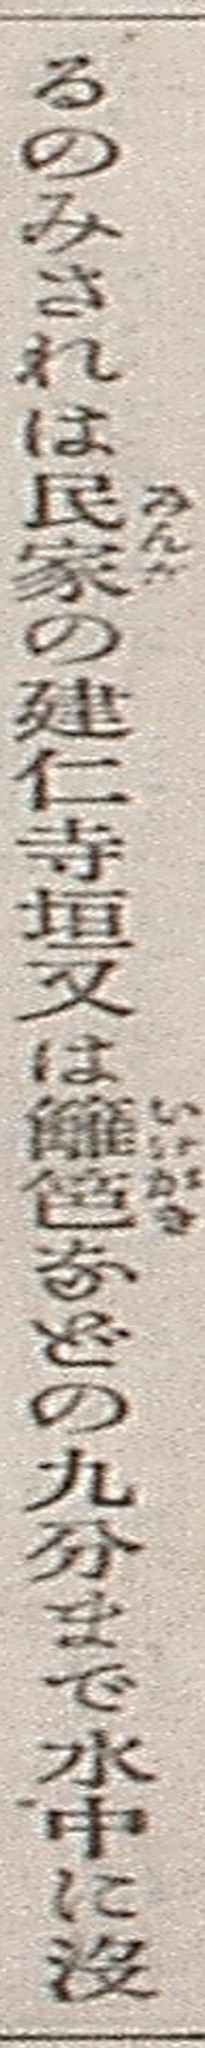るのみされは民家の建仁寺垣又は籬笆などの九分まで水中に没
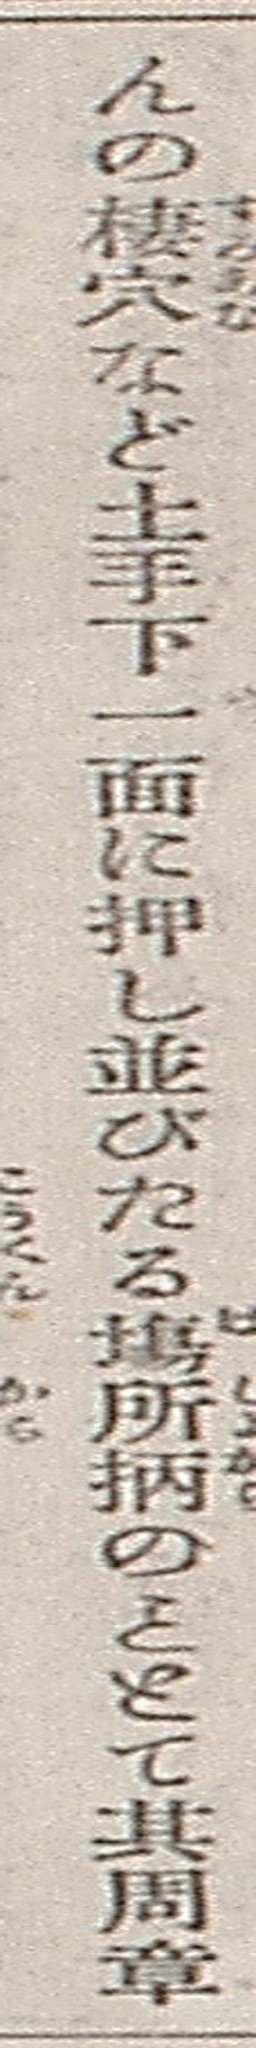んの棲穴など土手下一面に押し並びたる場所柄のこととて其周章
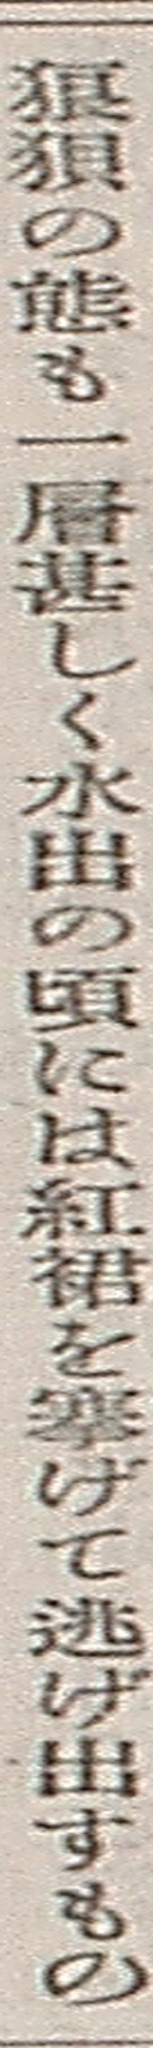狼狽の態も一層甚しく水出の頃には紅裙を搴げて逃げ出すもの
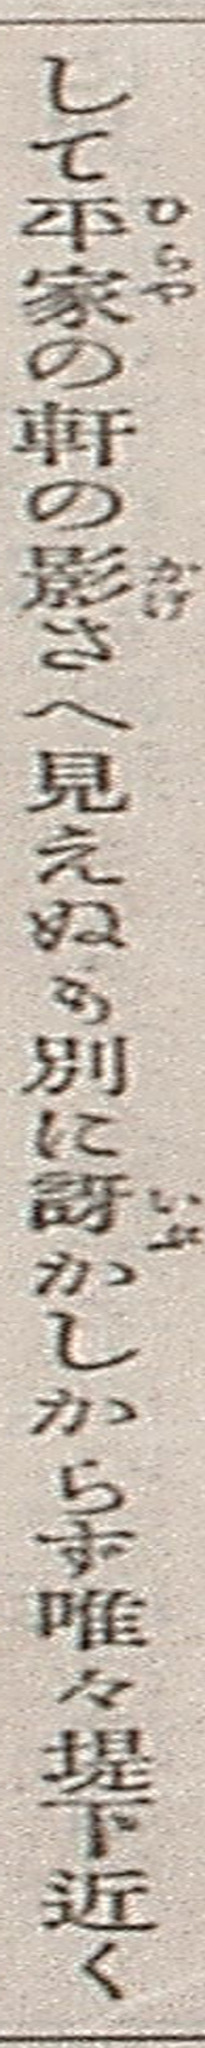して平屋の軒の影さへ見えぬも別に訝かしからず唯々堤下近く
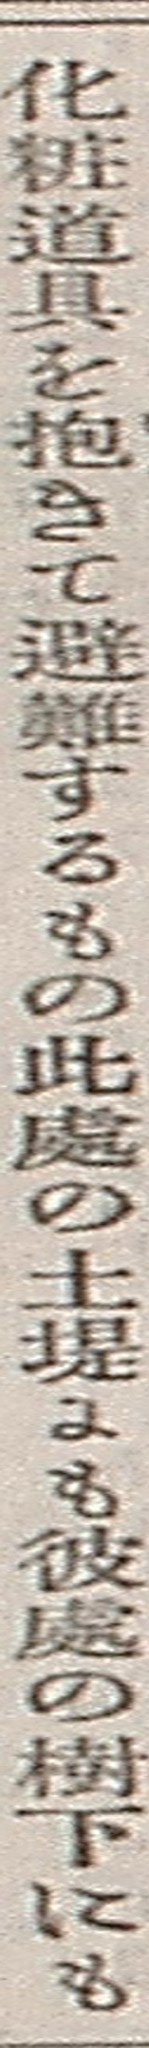化粧道具を抱きて避難するもの此処の土堤にも彼処の樹下にも
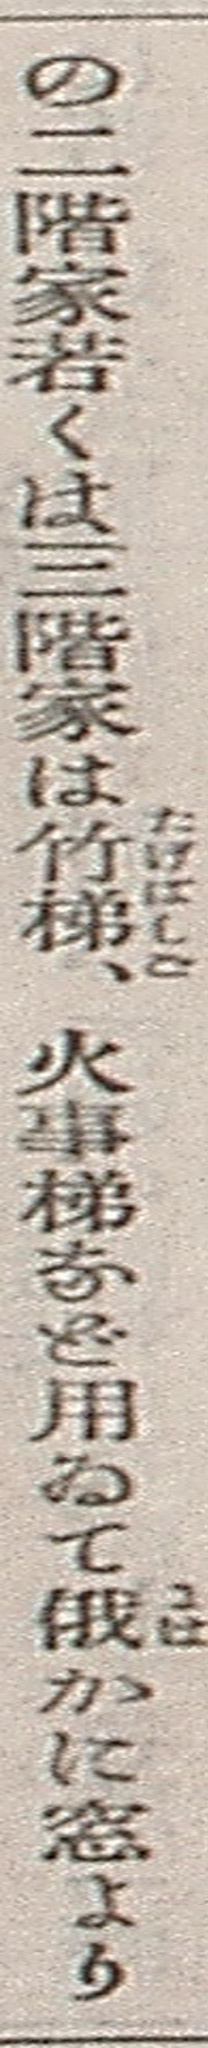の二階家若くは三階家は竹梯、火事梯など用ゐて俄かに窓より

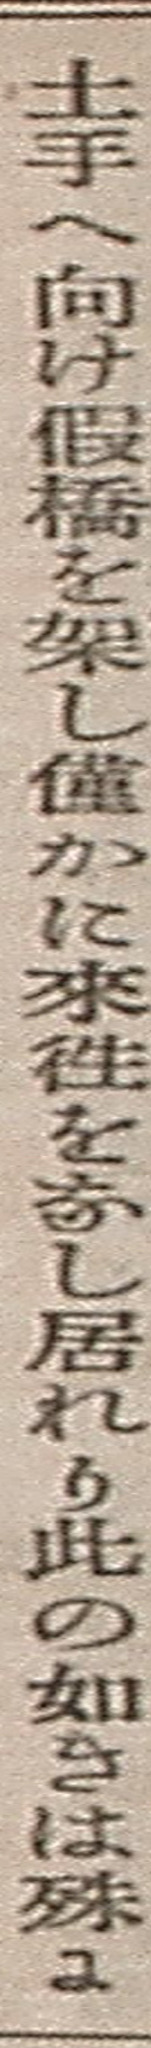土手へ向け仮橋を架し僅かに来往をなし居れり此の如きは殊に
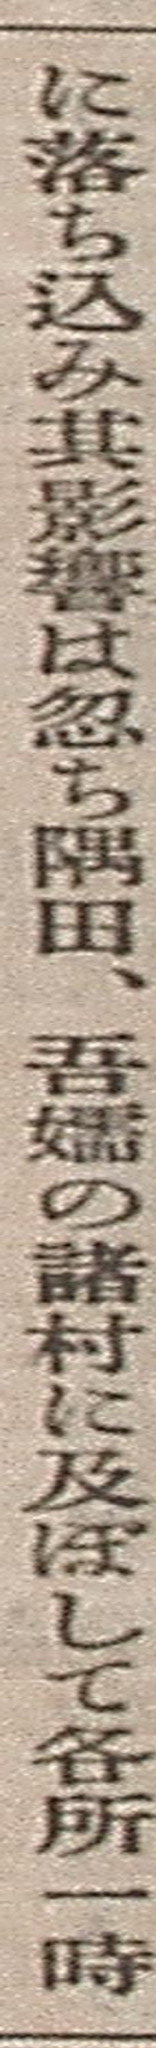に落ち込み其影響は忽ち隅田、吾嬬の諸村に及ぼして各所一時
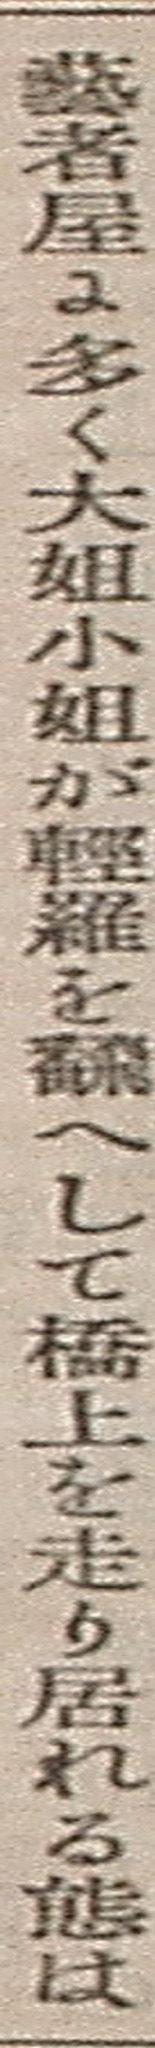芸者屋に多く大姐小姐が軽羅を翻へして橋上を走り居れる態は
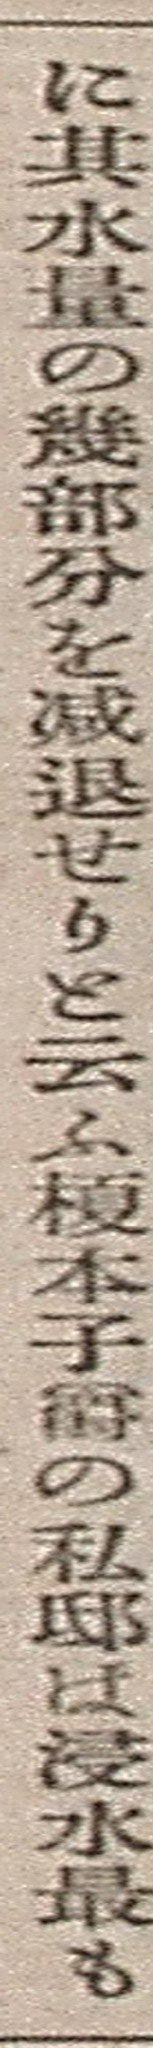に其水量の幾部分を減退せりと云ふ榎本子爵の私邸は浸水最も
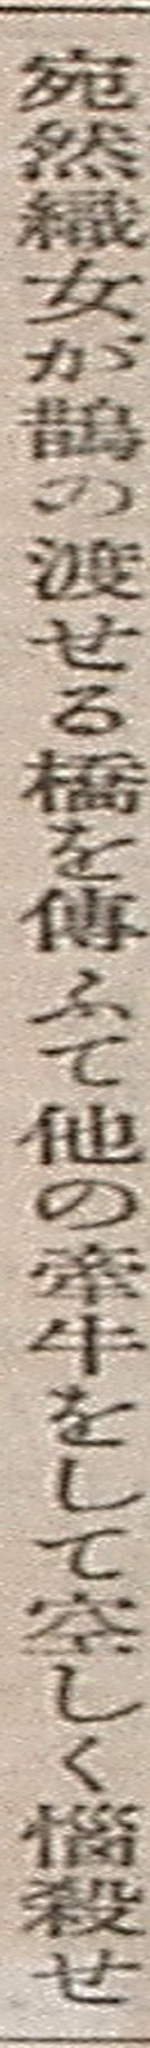宛然織女が鵲の渡せる橋を伝ふて他の牽牛をして空しく悩殺せ
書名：風俗畫報臨時増刊第百二十四號　洪水地震被害録（上）
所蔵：東京大学地震研究所図書室 Earthquake Research Institute Library, The University of Tokyo, JAPAN
